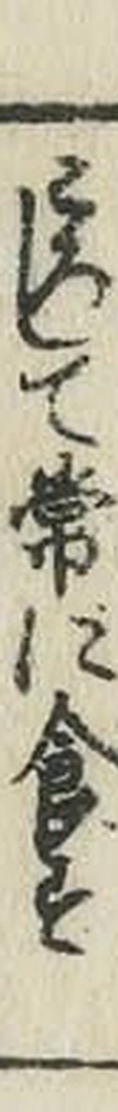ころして常に食す
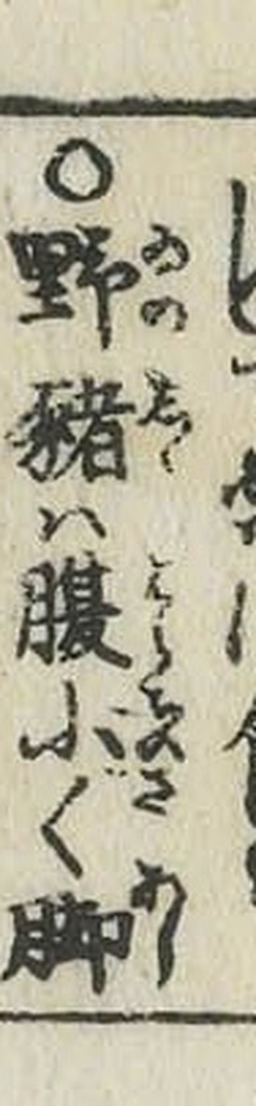○野豬は腹小く脚
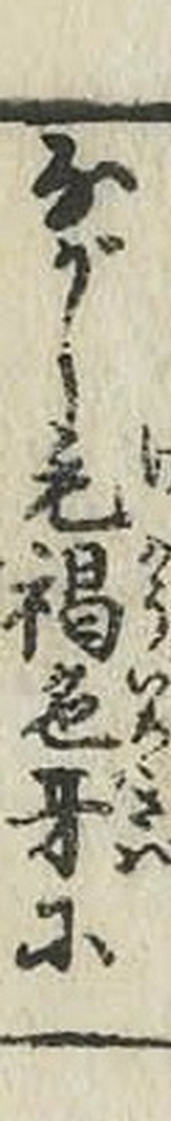ながし毛褐色牙に
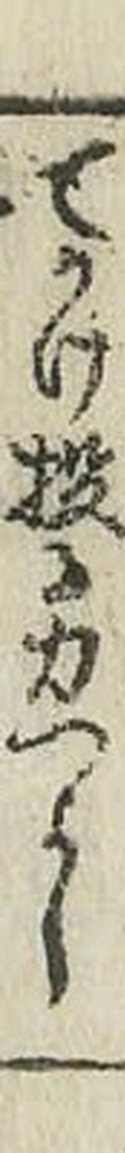てかけ投る力つよし
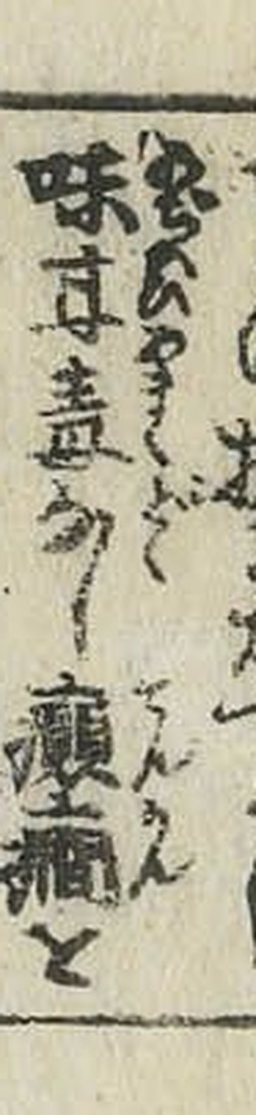味甘毒なし癲癇を
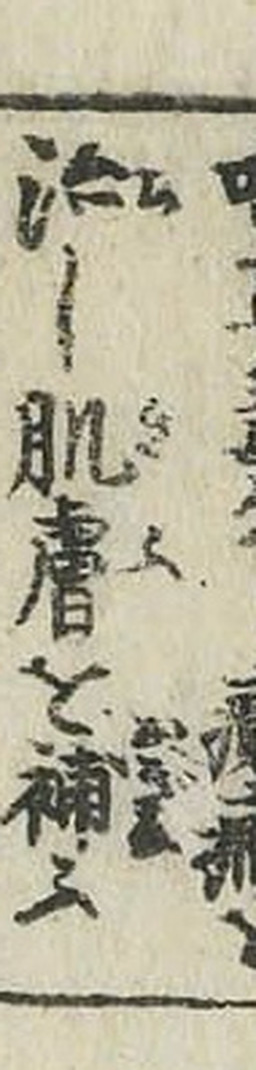治し肌膚を補ふ
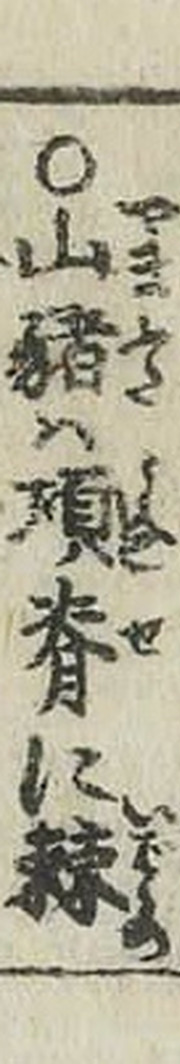○山豬は項背に棘
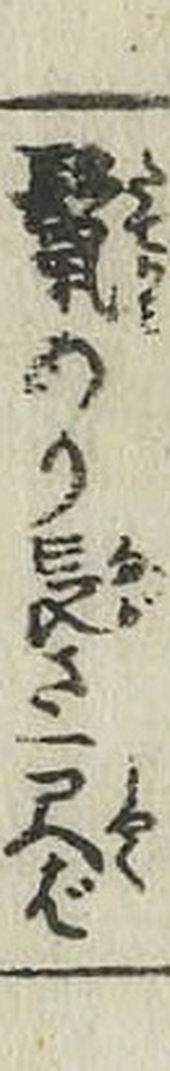鬣あり長さ一尺ば
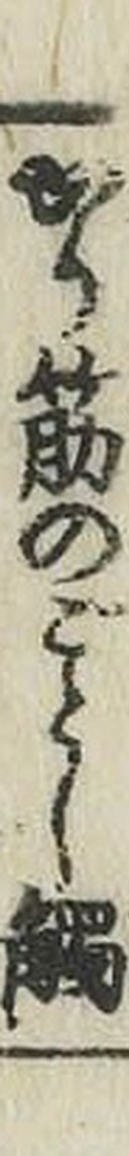かり筋のごとし触
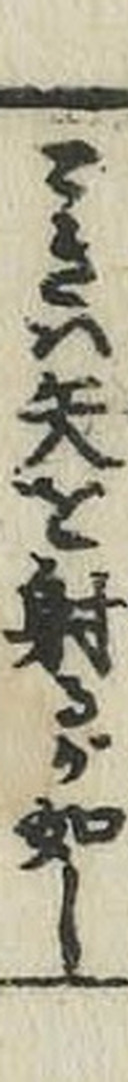ときは矢を射るが如し

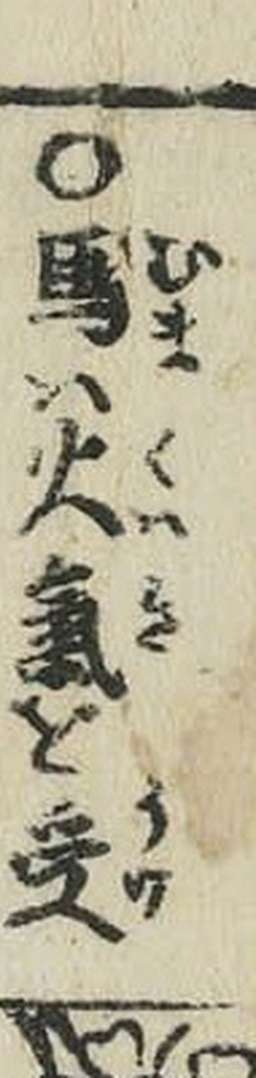○馬は火気を受
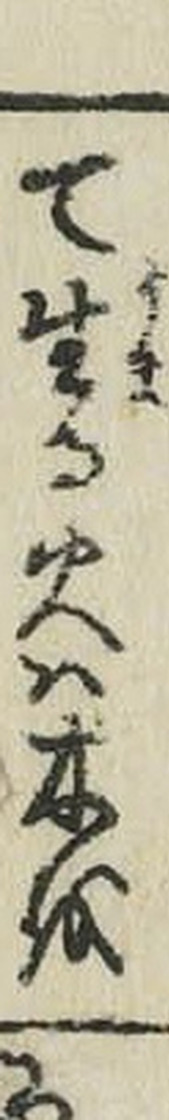て生る火は木を
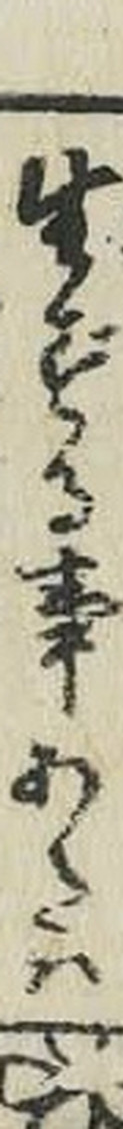生ずる事あたは
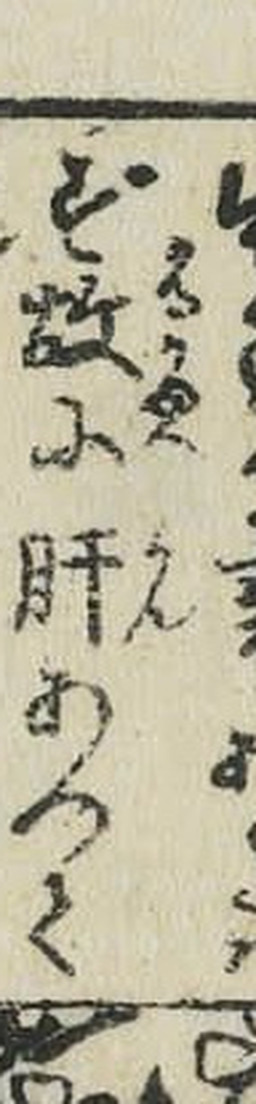ず故に肝あつて
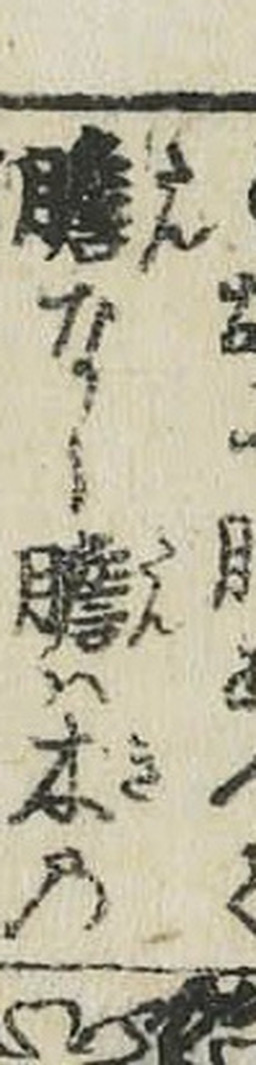胆なし胆は木の
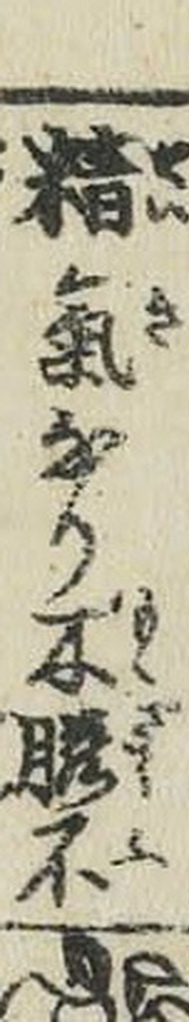精気なり木臓不
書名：増補頭書訓蒙図彙大成 10巻 6:巻之12-13
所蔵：東京学芸大学教育コンテンツアーカイブ
